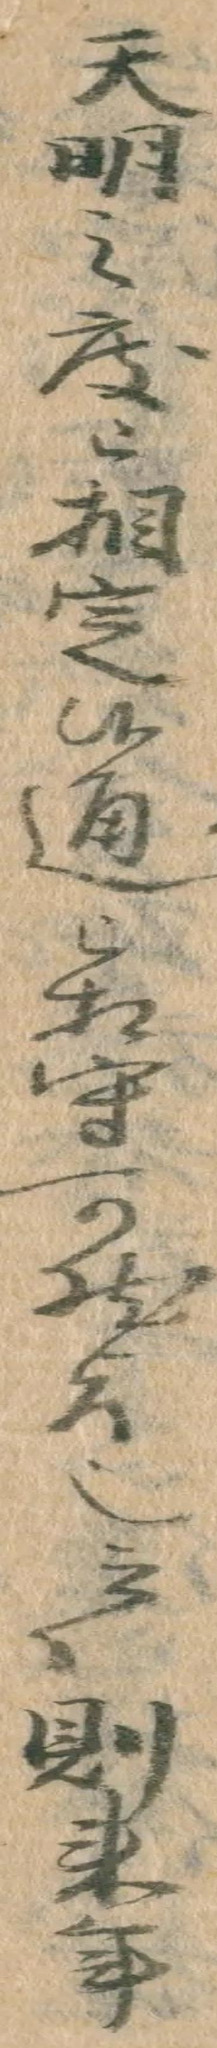天明之度被相定候通被相守可然旨也云々則来年
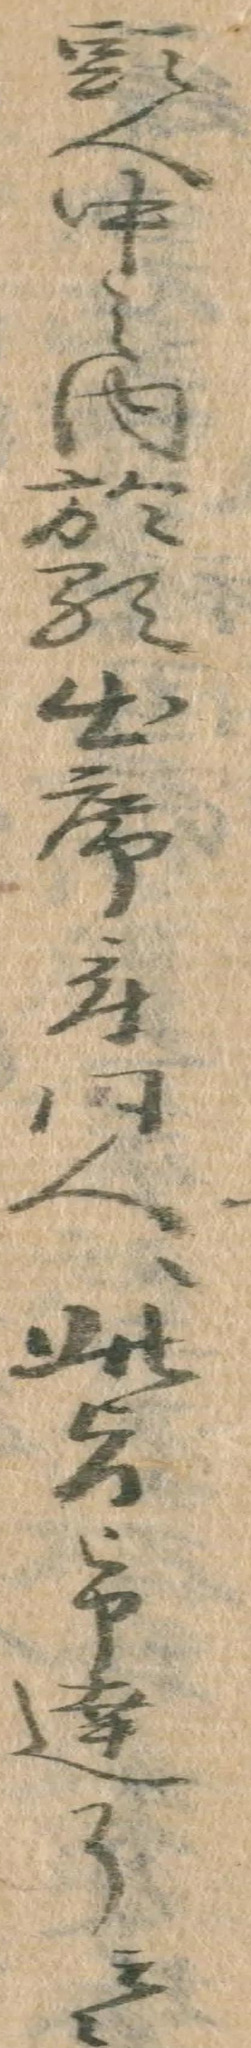頭人中之内於顕出席ニ付同人へ此旨被申達有之云々
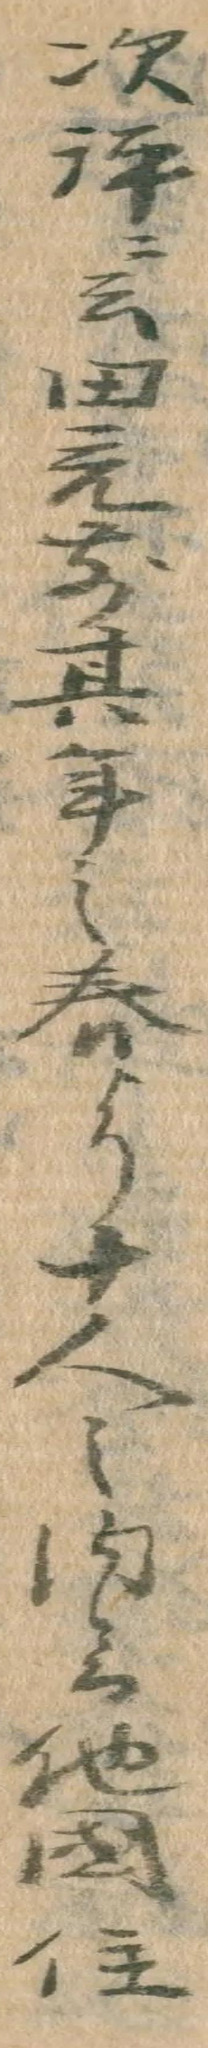次評ニ云田充前其年之春より十人之内ニ而他國住
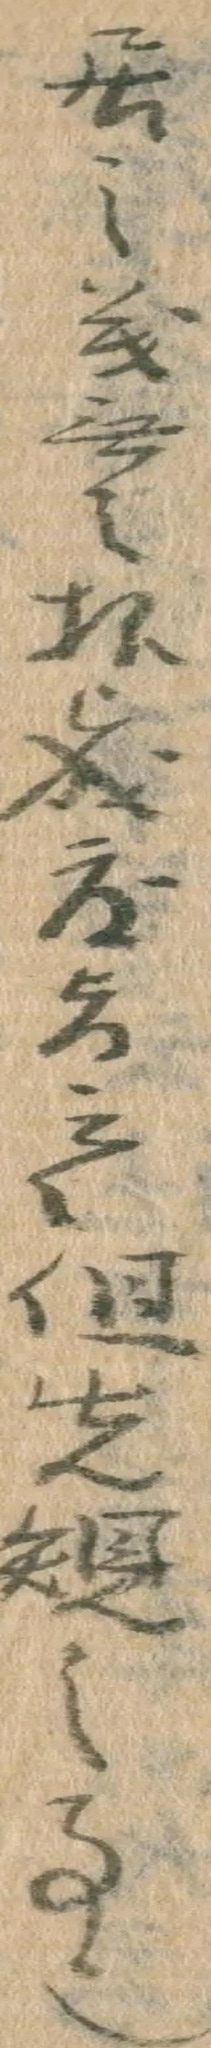居之義無之様被成度旨云々但先規之事也
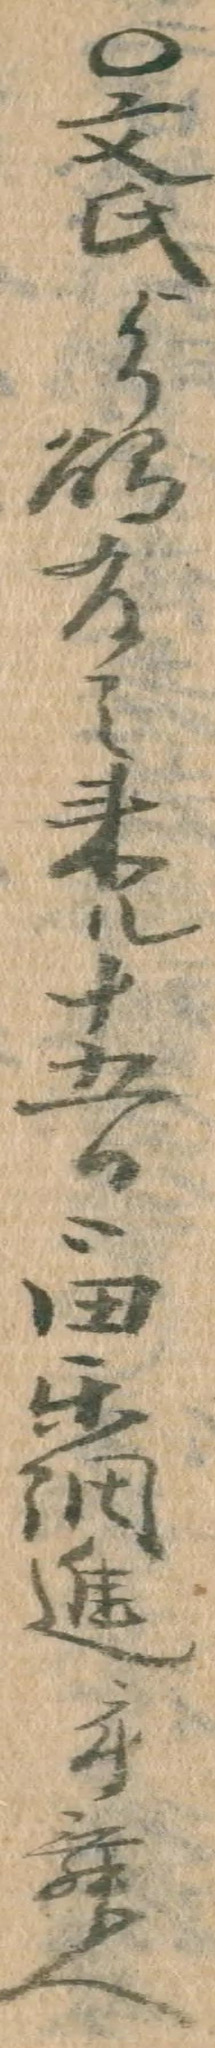○文氏より触有之来ル十五日御田楽調進ニ付舞人
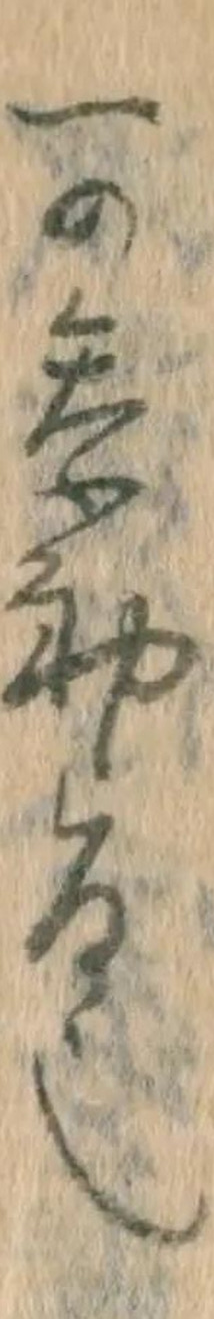可参勤旨也
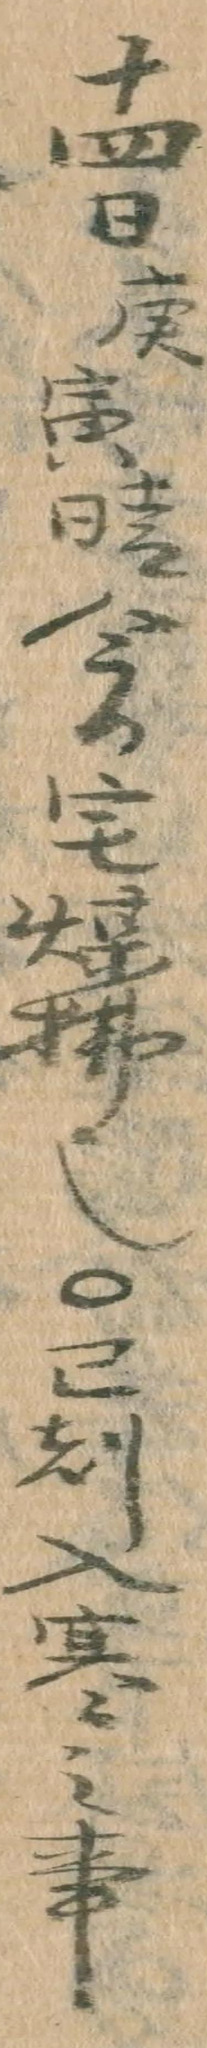十四日庚寅晴今日宅煤払也〇巳刻入寒之事
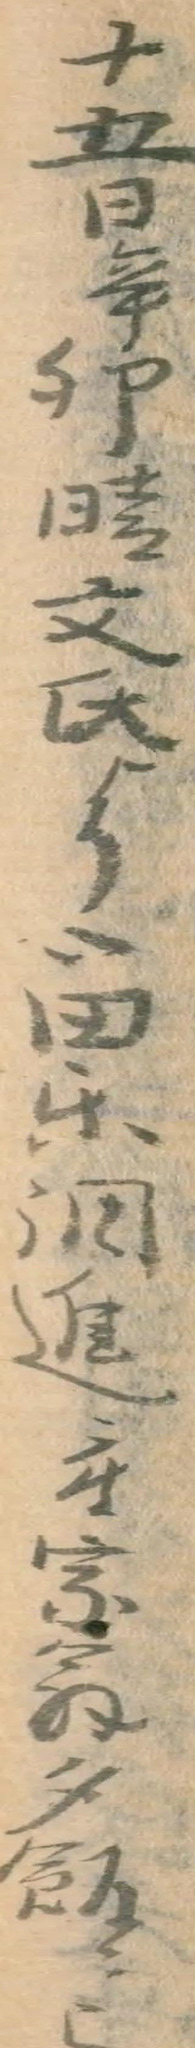十五日辛卯晴文氏より御田楽調進ニ付家翁夕飯ニ而
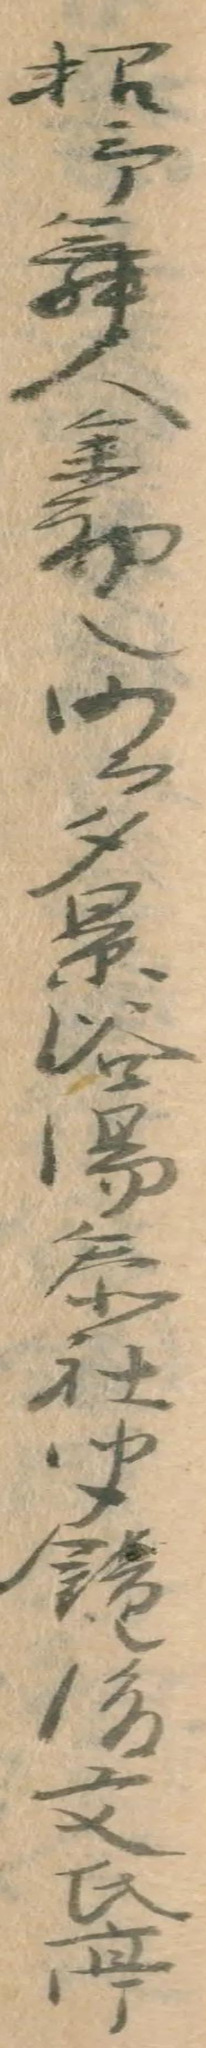招予舞人参初之仍而夕景浴湯参社聞餝後文氏亭
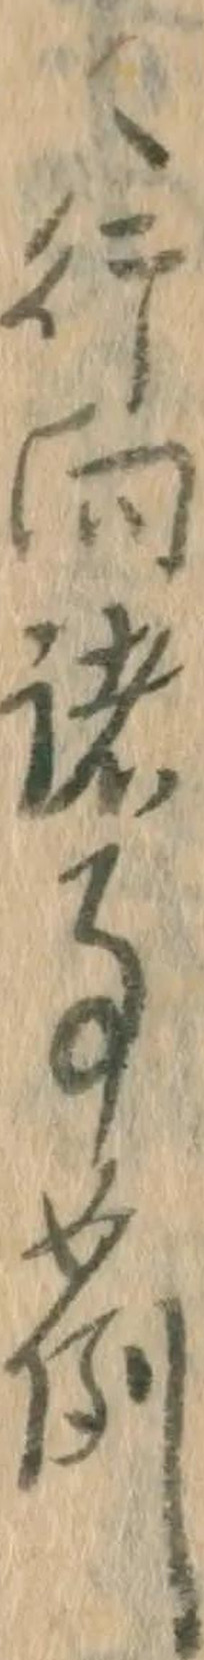行向諸事如例
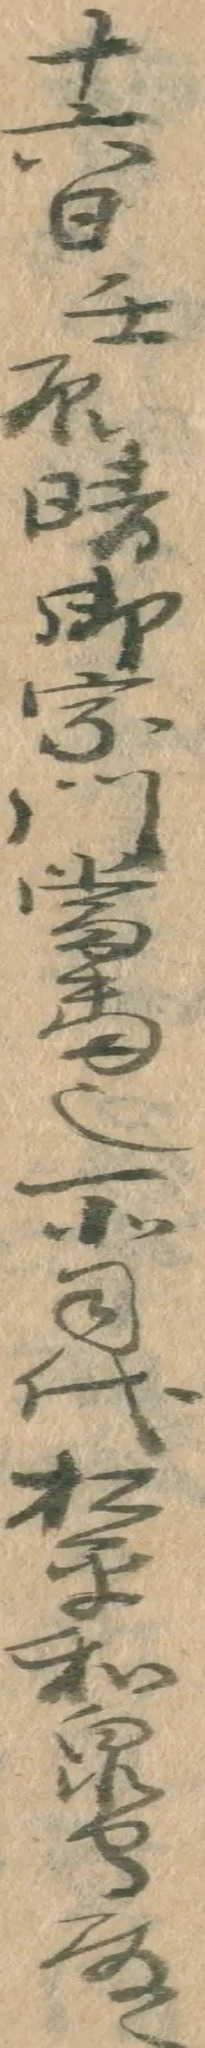十六日壬辰晴御家門當番也所司代松平和泉守殿へ
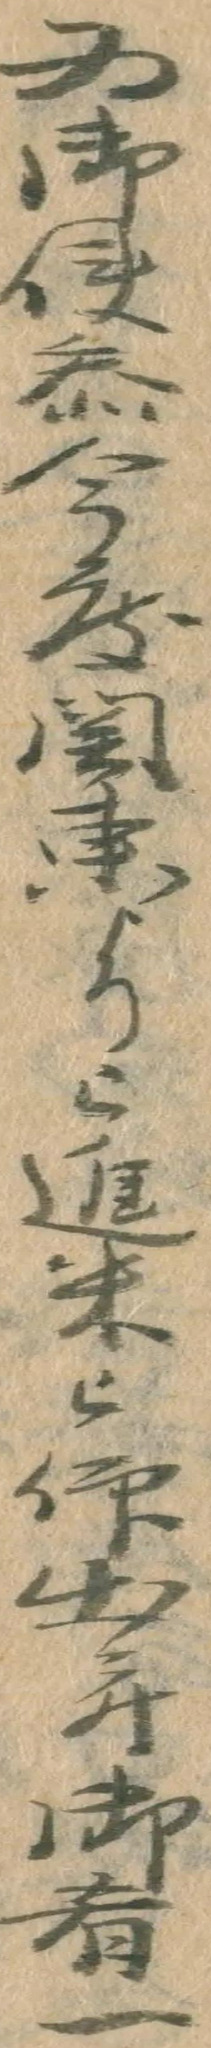為御使参今度関東より被進米被仰出并御肴一
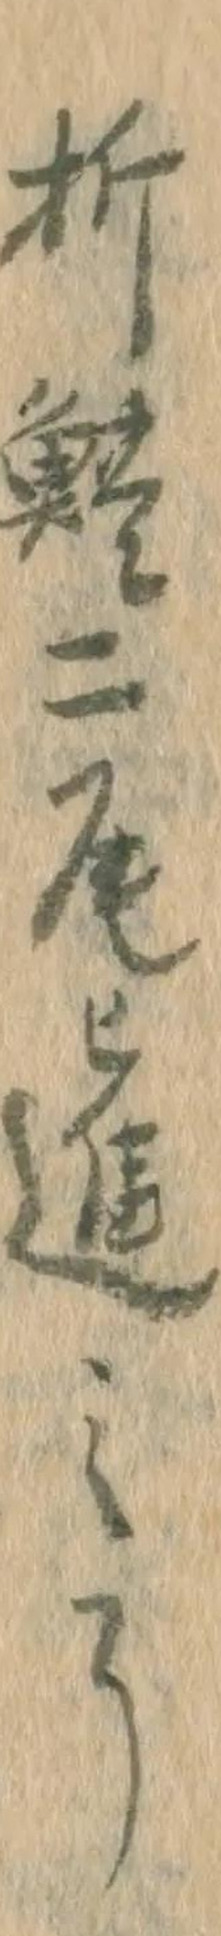折鮑二尾被進之了
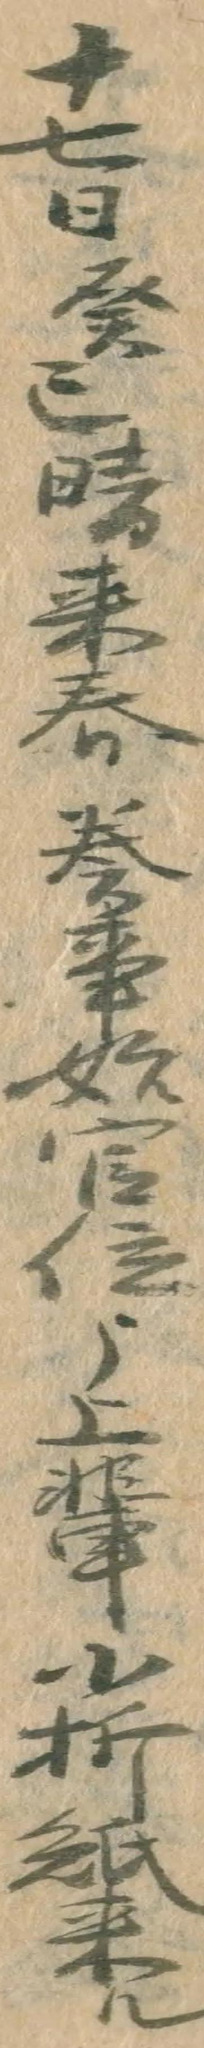十七日癸巳晴来春奏事始官位申上輩小折紙来ル
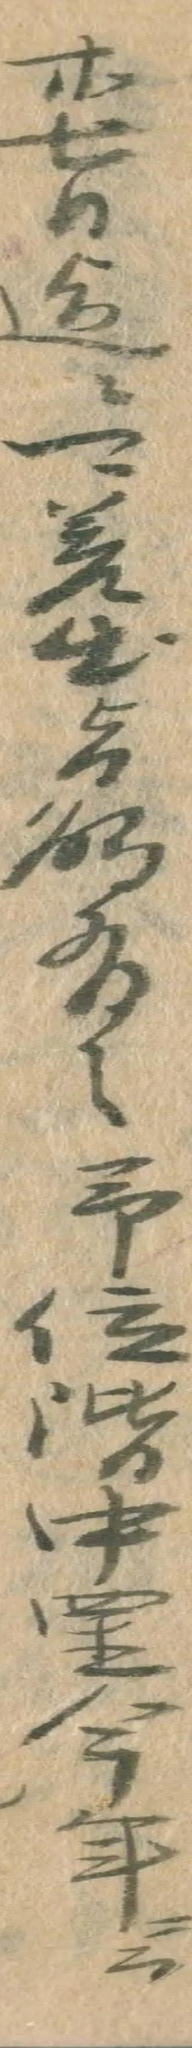廿七日迄ニ可差出旨触有之予位階中置今年ニ而
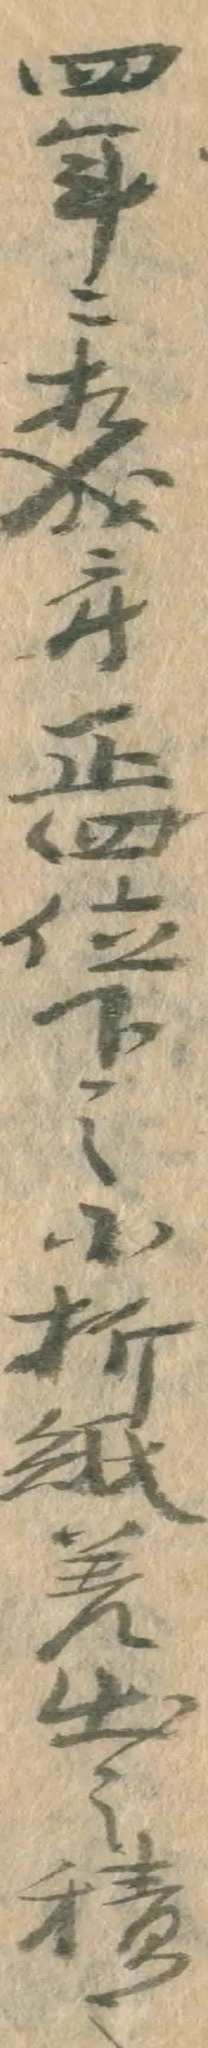四年ニ相成ニ付正四位下之小折紙差出之積也
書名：賀茂社記録. 第63冊
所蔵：国立国会図書館 National Diet Library, JAPAN
